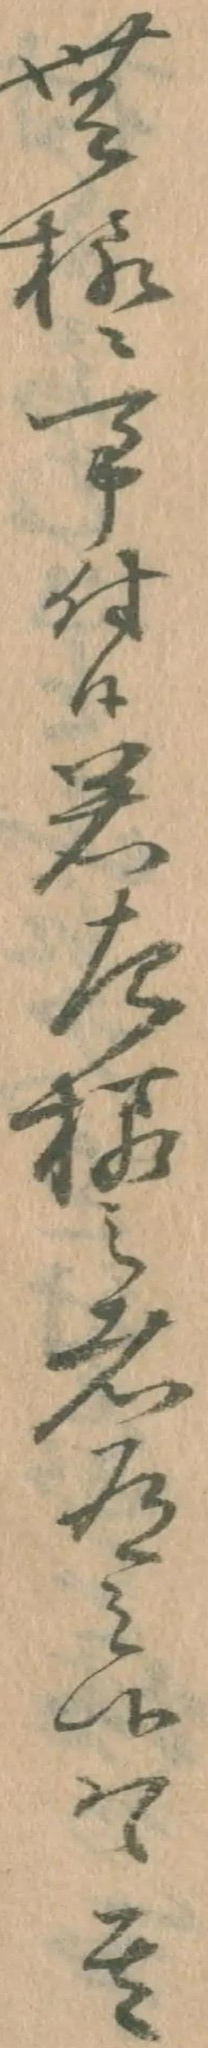無様に可申付候若左様之者為之候はゝ其
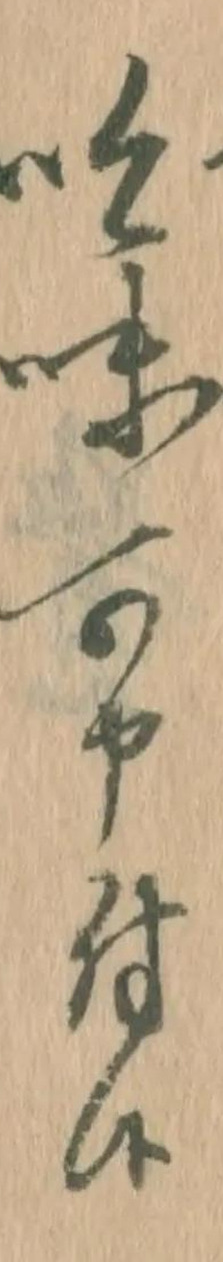吟味可申付候
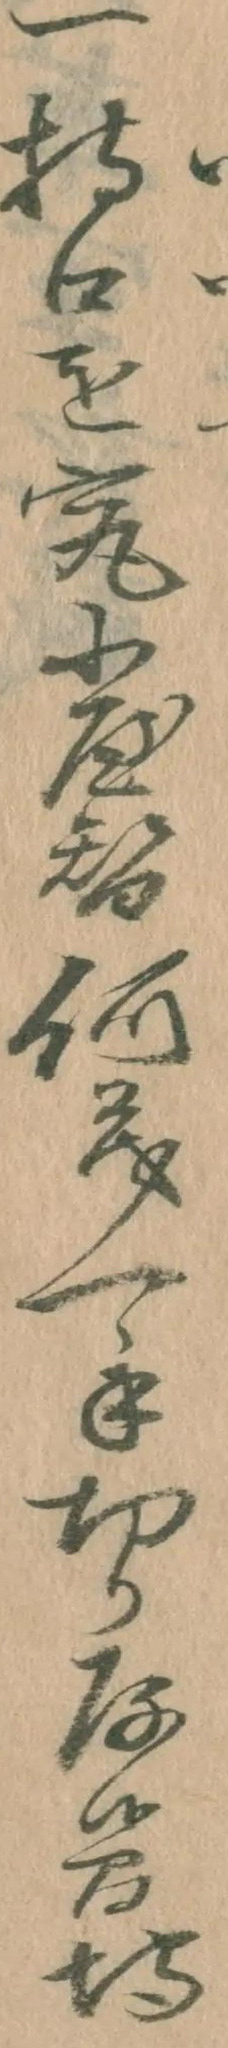一持口を究小屋替何茂一手切り存候間埒
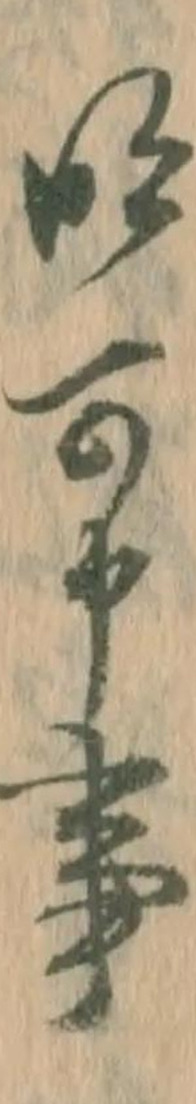明可申事
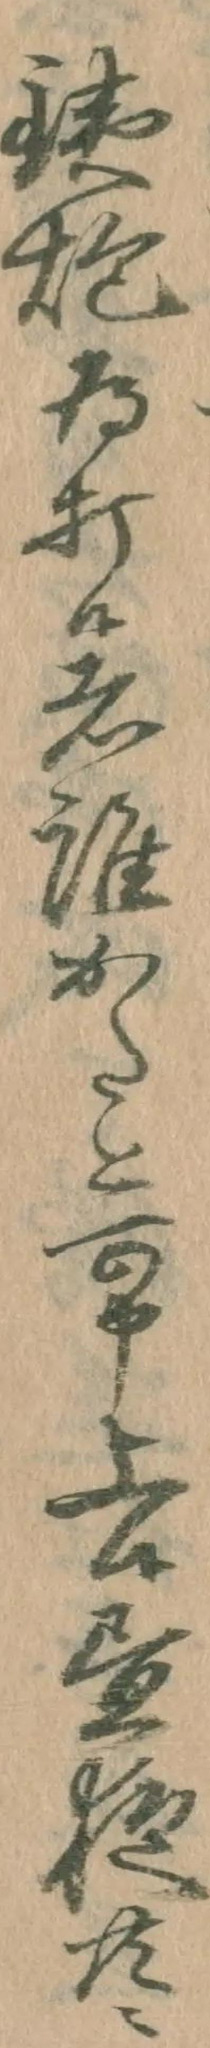一鉄砲為打候者誰かたと可申上候昼夜共に
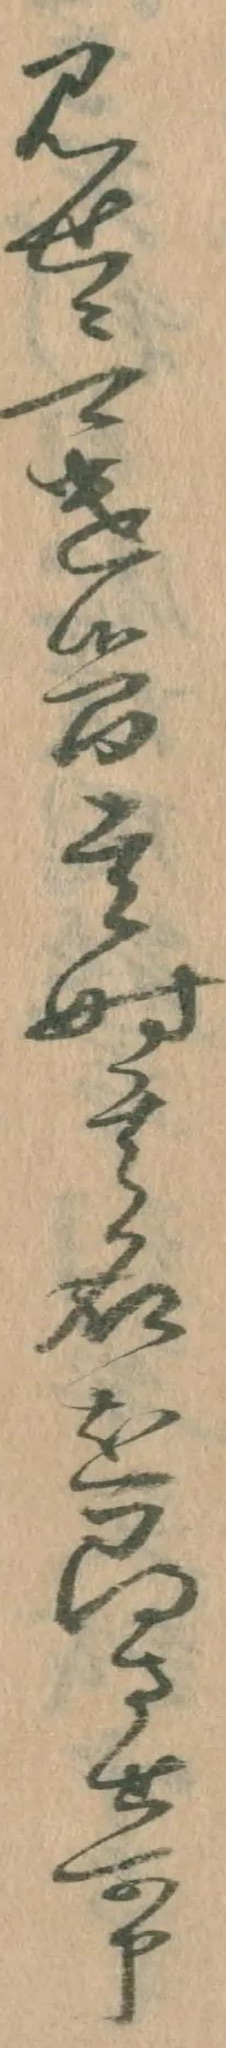見せに可遣候間其時其名を尋させ可申
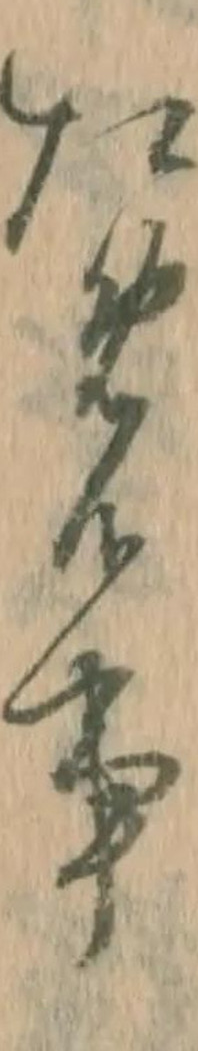た免候事
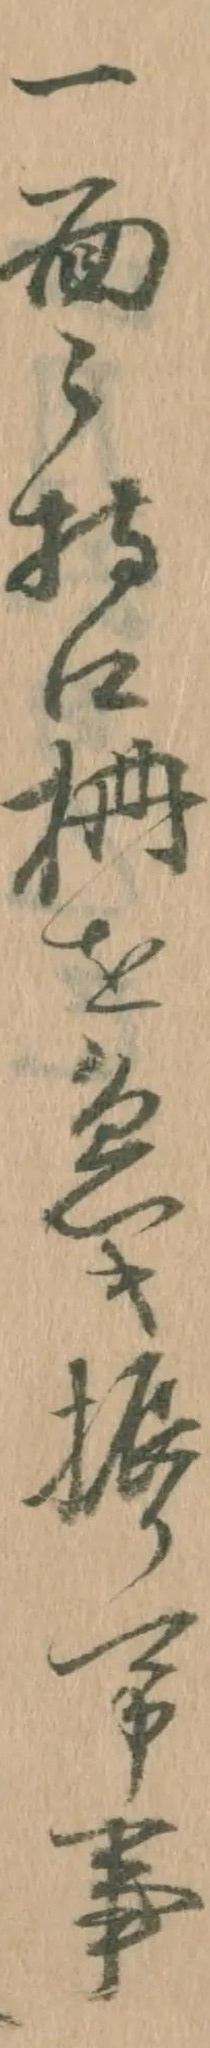一面々持口柵を急き振り可申事
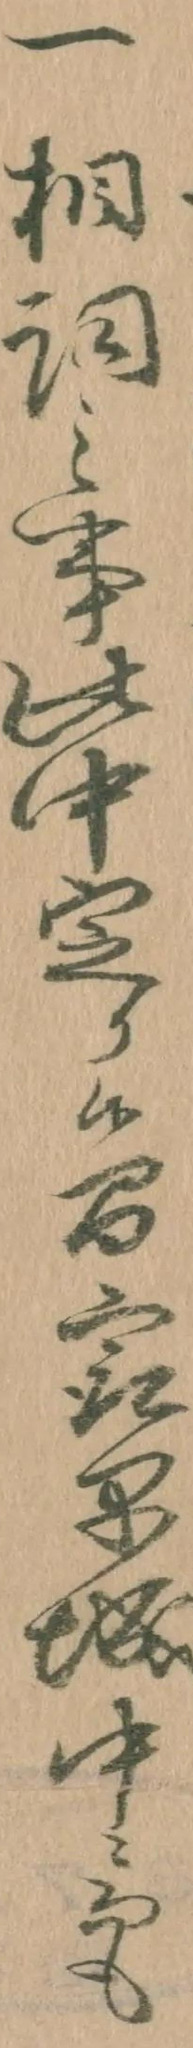一相詞之事此中定り候間最早城中に而も
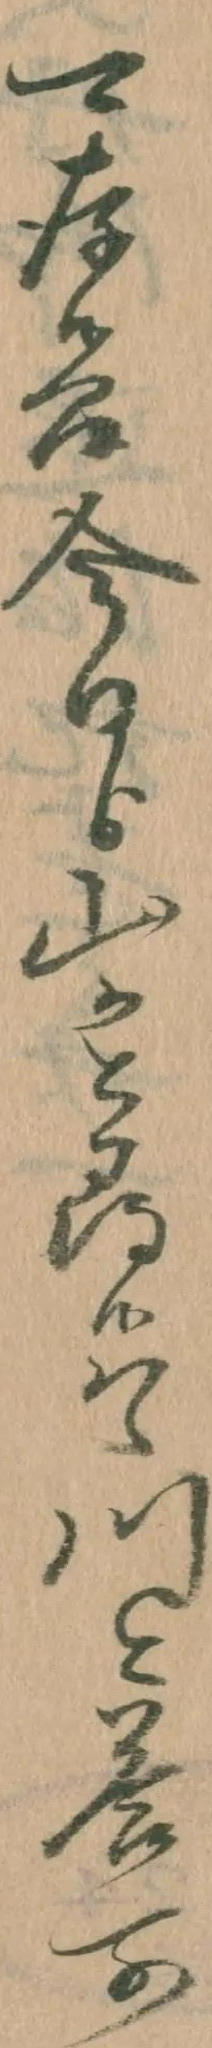可存候間今日ゟ山かと尋候はゝ川と答可
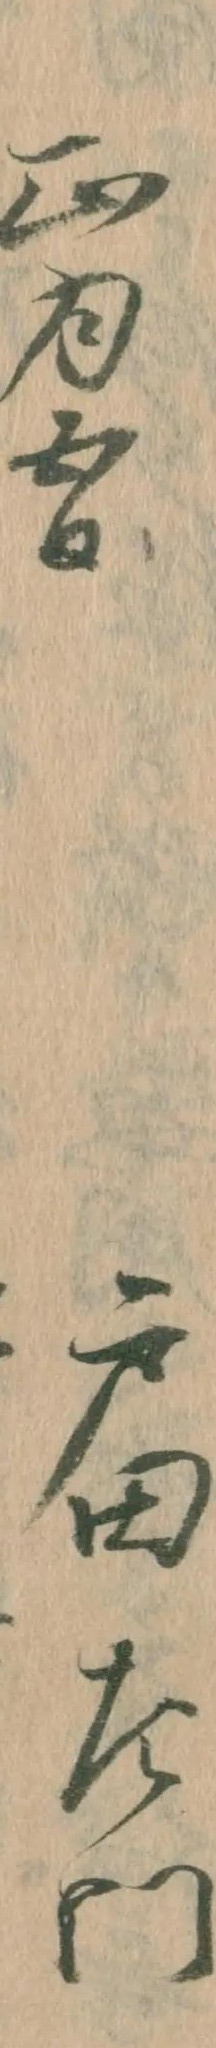正月五日戸田左門
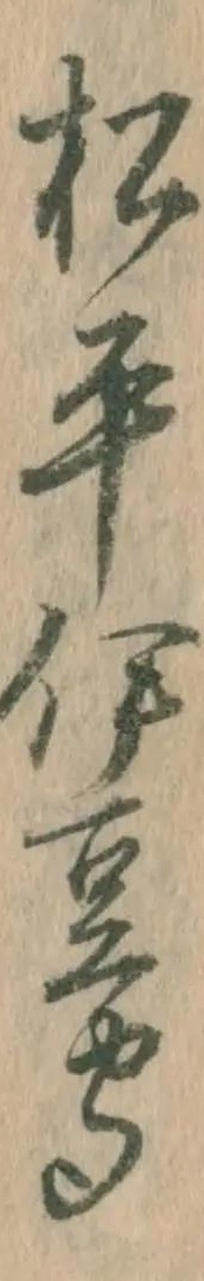松平伊豆守
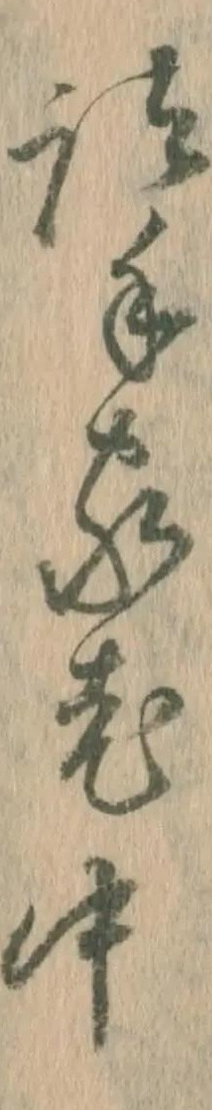諸手家老中
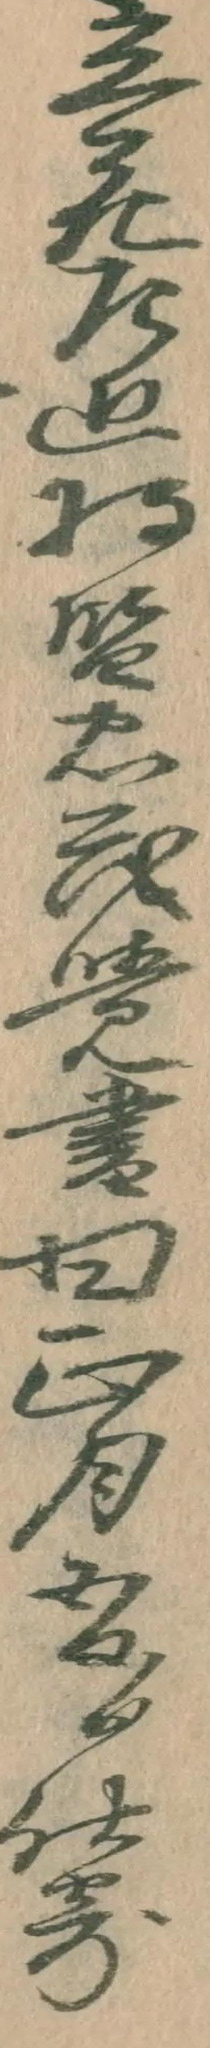立花左近将監忠茂覚書曰正月五日ゟ仕寄
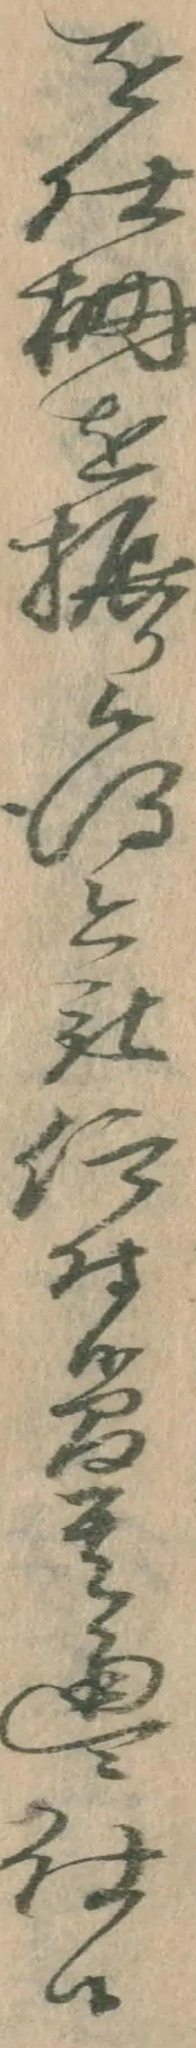を仕柵を振り候得と被仰付候間其通に仕候
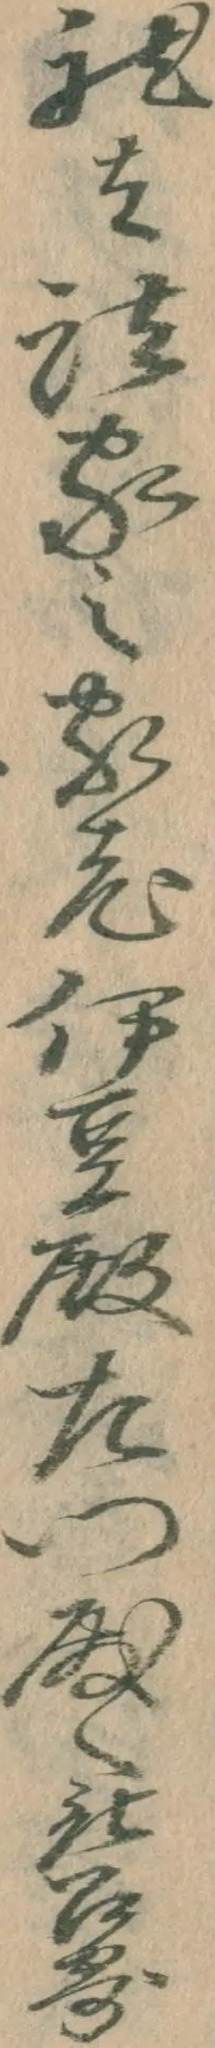然者諸家之家老伊豆殿左門殿へ被召寄
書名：切支丹御退治記 49巻. [5]
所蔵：国立国会図書館 National Diet Library, JAPAN
